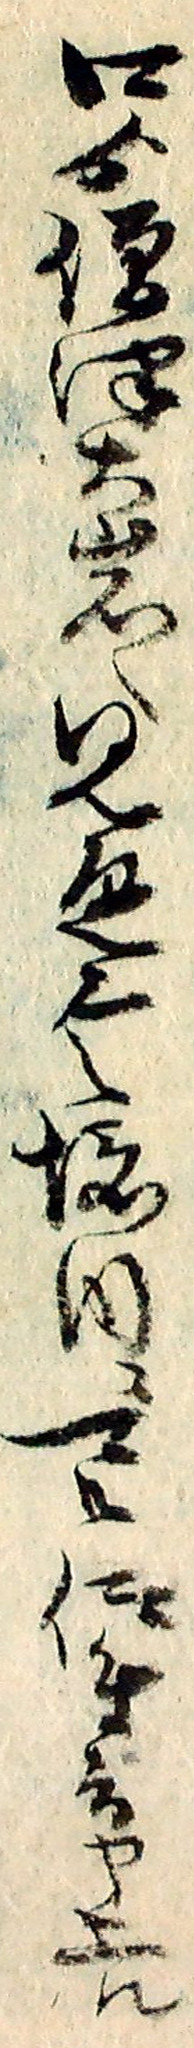口ゟ僧津大岩へ見通し之境内に可被仰付旨申上候
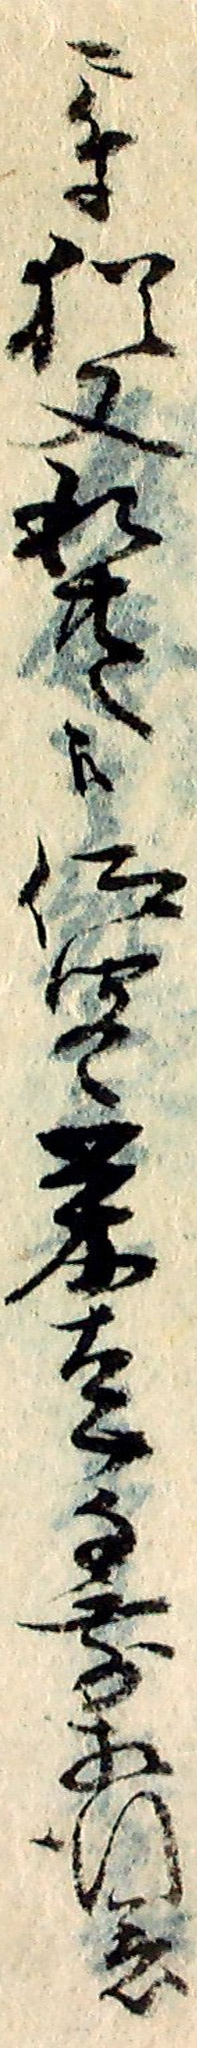に付猶又私共へ被仰聞栄太郎手前相行着
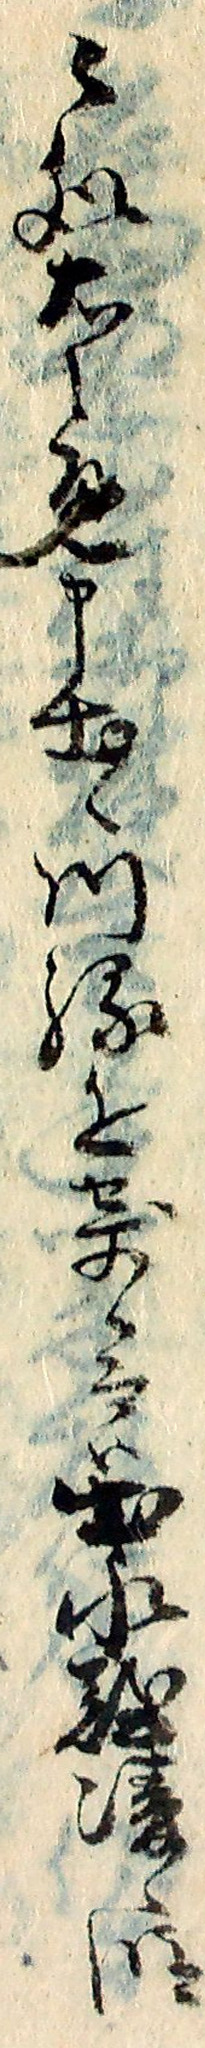候処右之通申出候川縁近寄候ては出水難凌候段
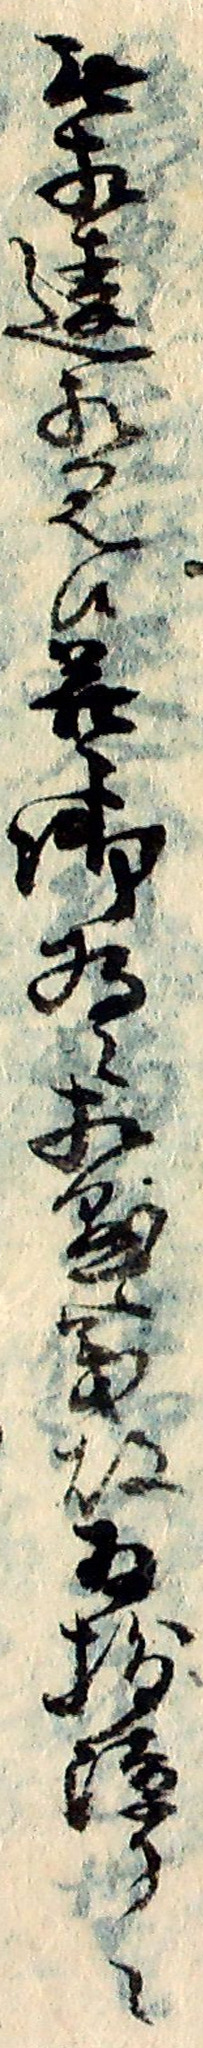無相違相見候並に御為に相懸候義故為指障りに
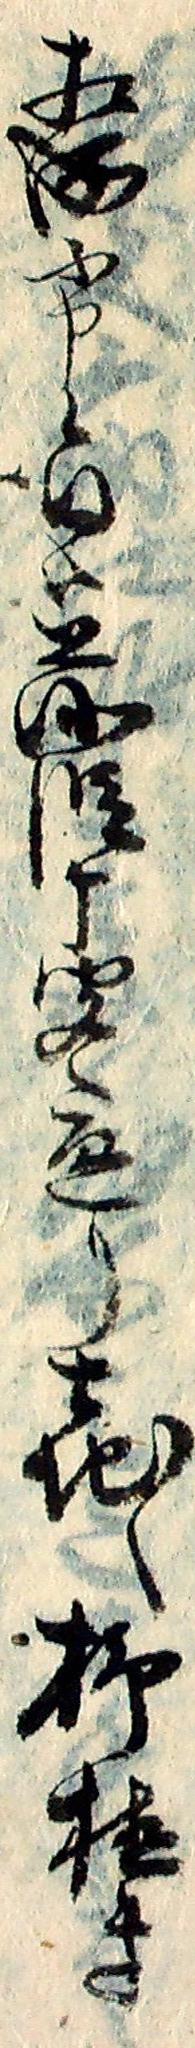相成不申候得は前段申聞候通り土地へ柳植付
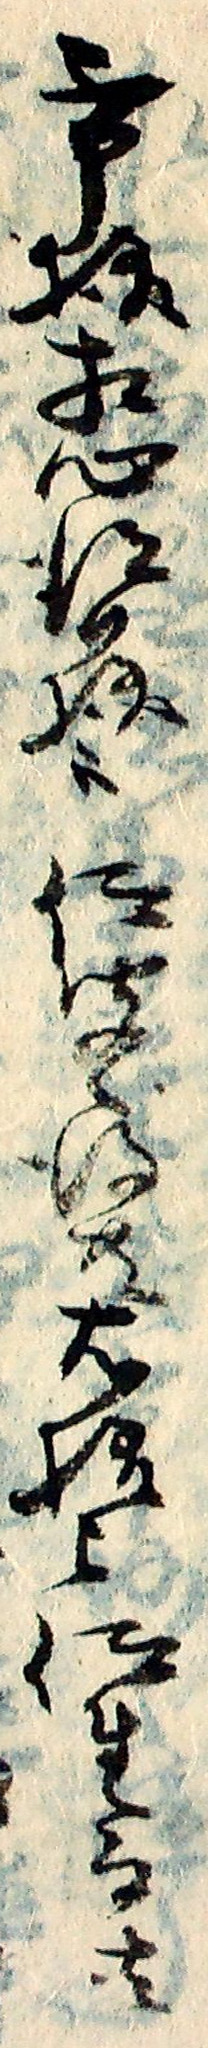不申様相心得候様被仰聞候得共右様被仰付候ては
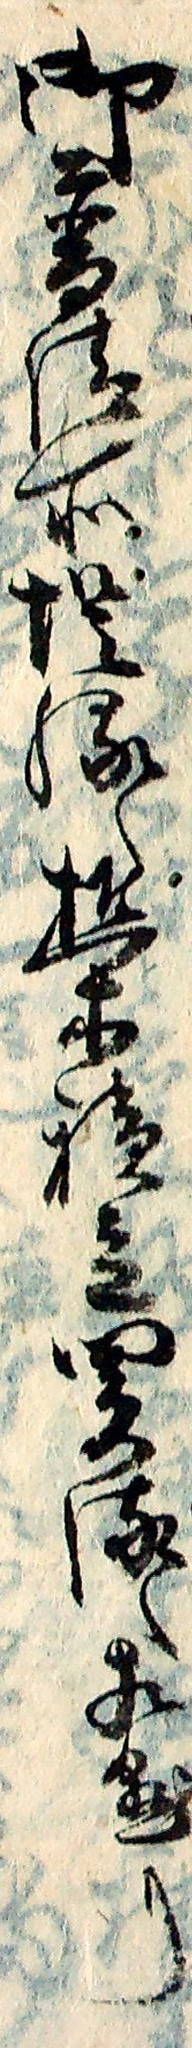御普請所堤縁へ樵木積立買流へ相懸り
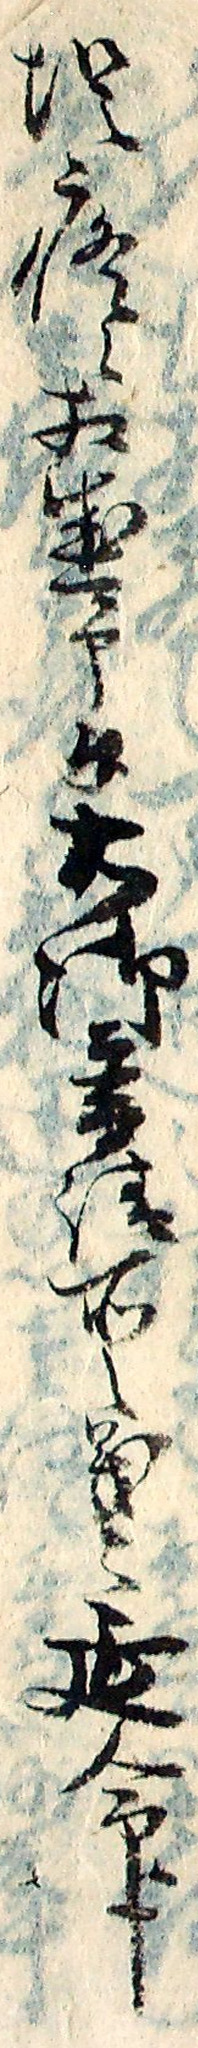堤疼に相成可申候右御普請所之義は延命

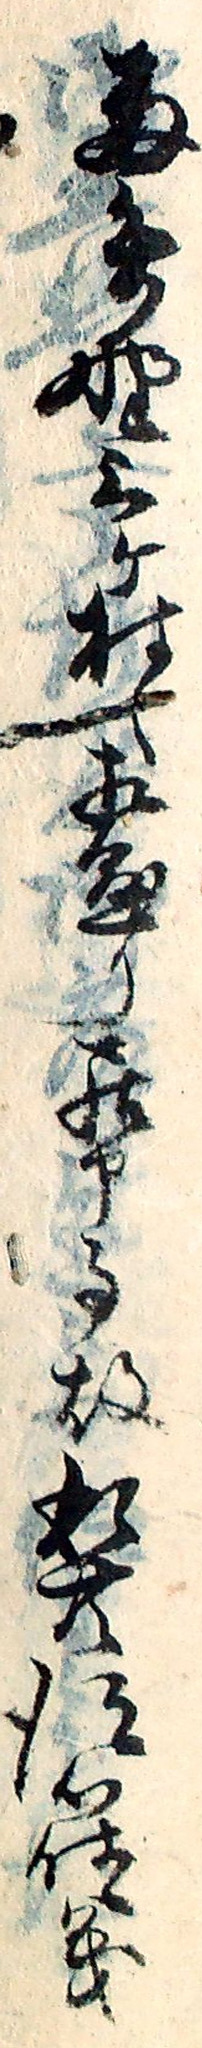両矢野三ヶ村へ相懸り居申事故私共得心仕候義
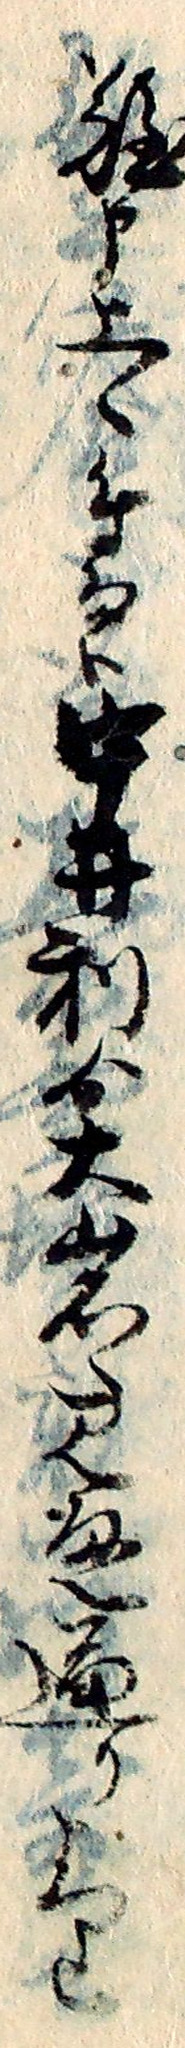難申上候付ては中井利ゟ大岩へ見通通りより
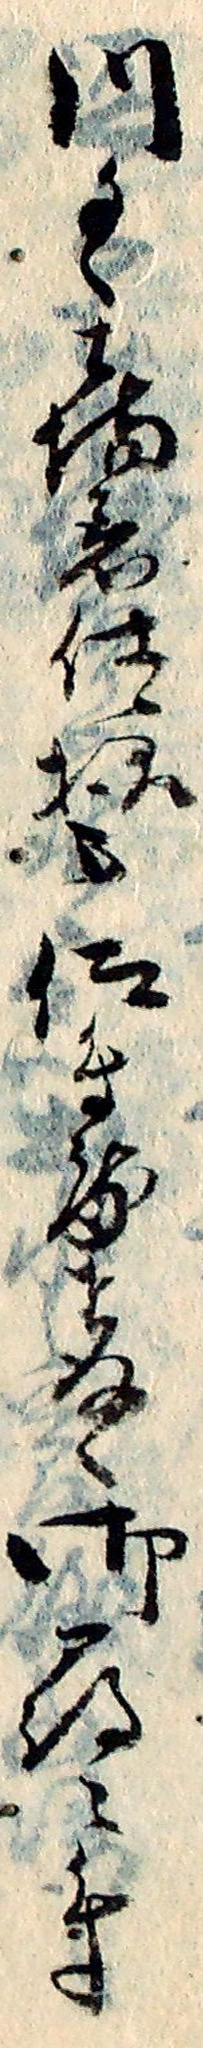川手へ土場着仕候様被仰付度奉存候御尋に付
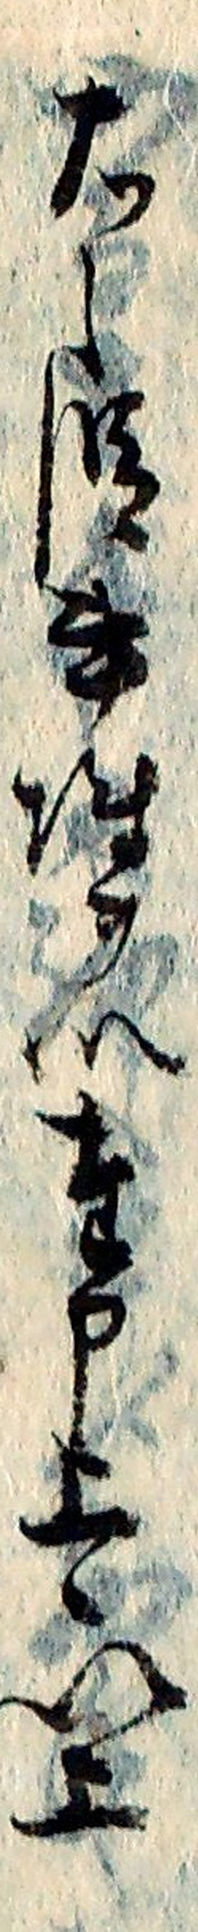右之段書付を以奉申上候以上
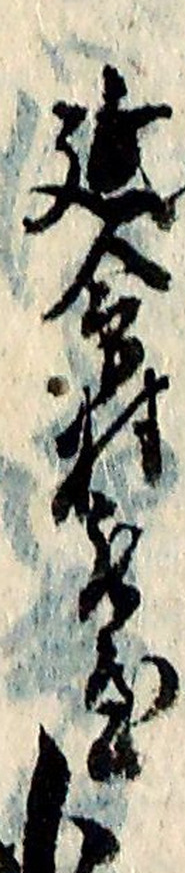延命村庄屋
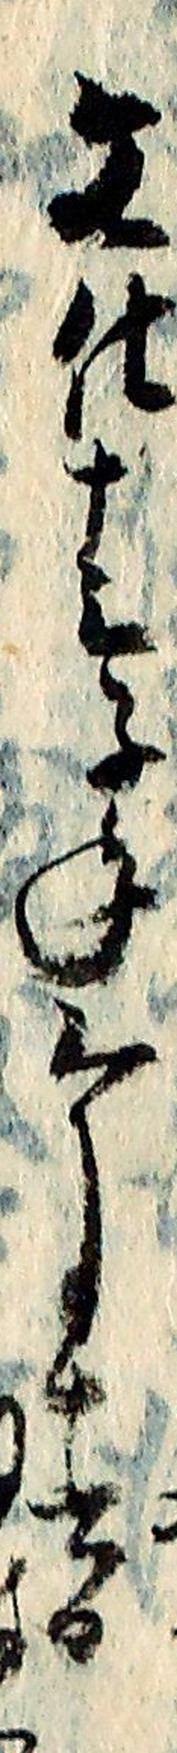文化十三子年三月十六日
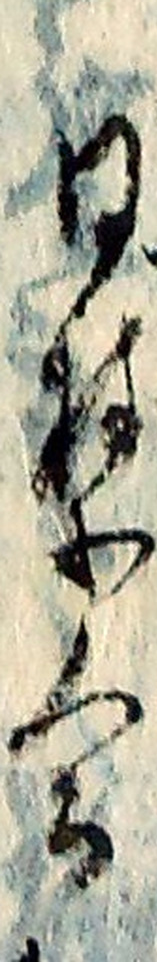同村五人与
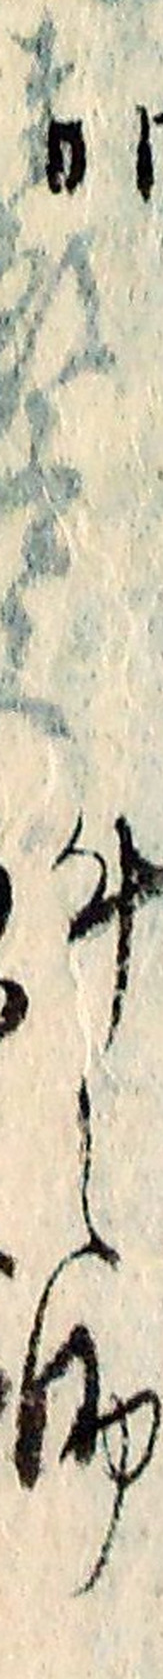同牛之助
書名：諸御願書控(後藤氏壱番）
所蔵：鳴門教育大学 Naruto University of Education
